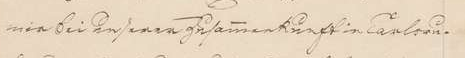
mir bei unserer Zusammenkunft in Carlsru-
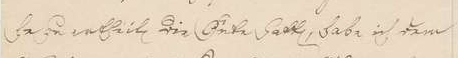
he zu ertheilen die Güte hatten, habe ich dem
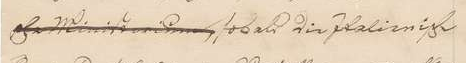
sche Ministerium sobald die Italienische
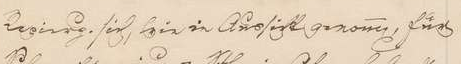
Regierg. sich, wie in Aussicht genommen, für
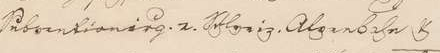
Subventionirg. e. Schweiz. Alpenbahn &
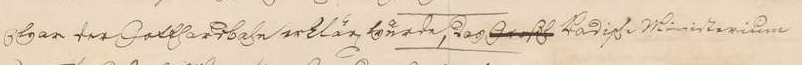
zwar der Gotthardbahn erklären würde, das GroßhBadische Ministerium
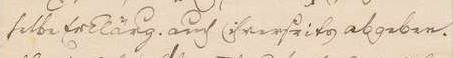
selbe Erklärg. auch ihrerseits abgeben.
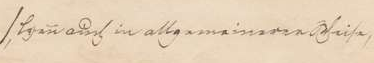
wenn auch in allgemeinerer Weise,
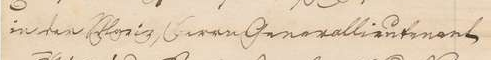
in der Schweiz, Herrn Generallieutenant
